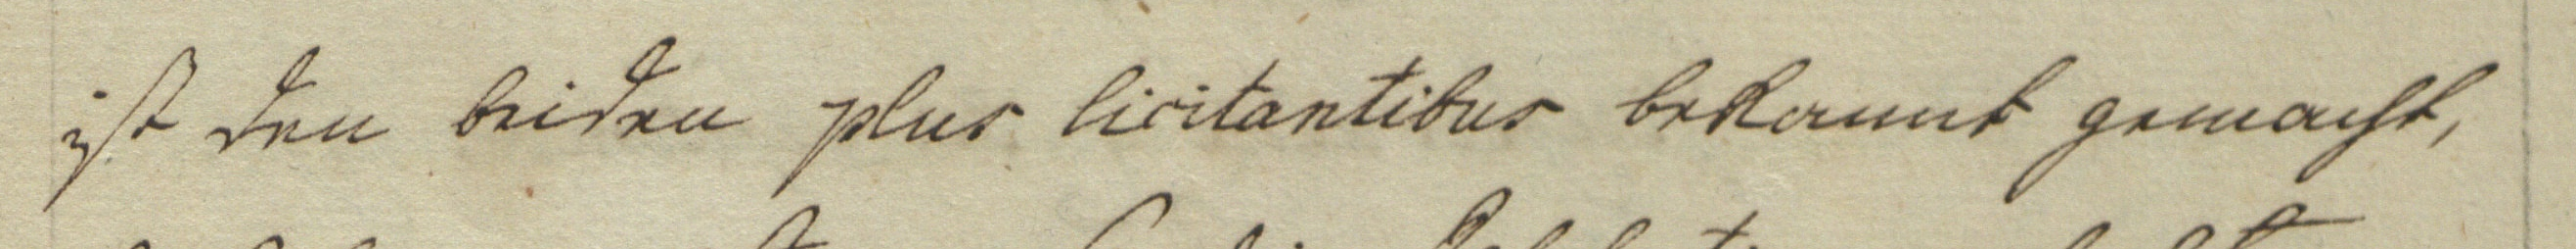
ist den beiden plus licitantibus bekannt gemacht,
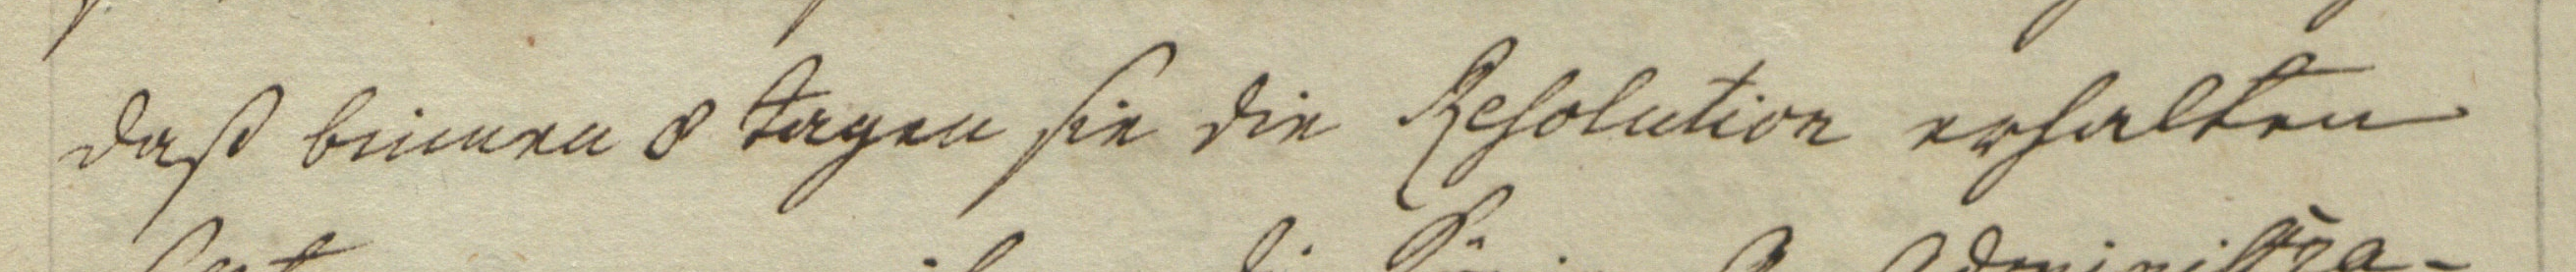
daß binnen 8 Tagen sie die Resolution erhalten
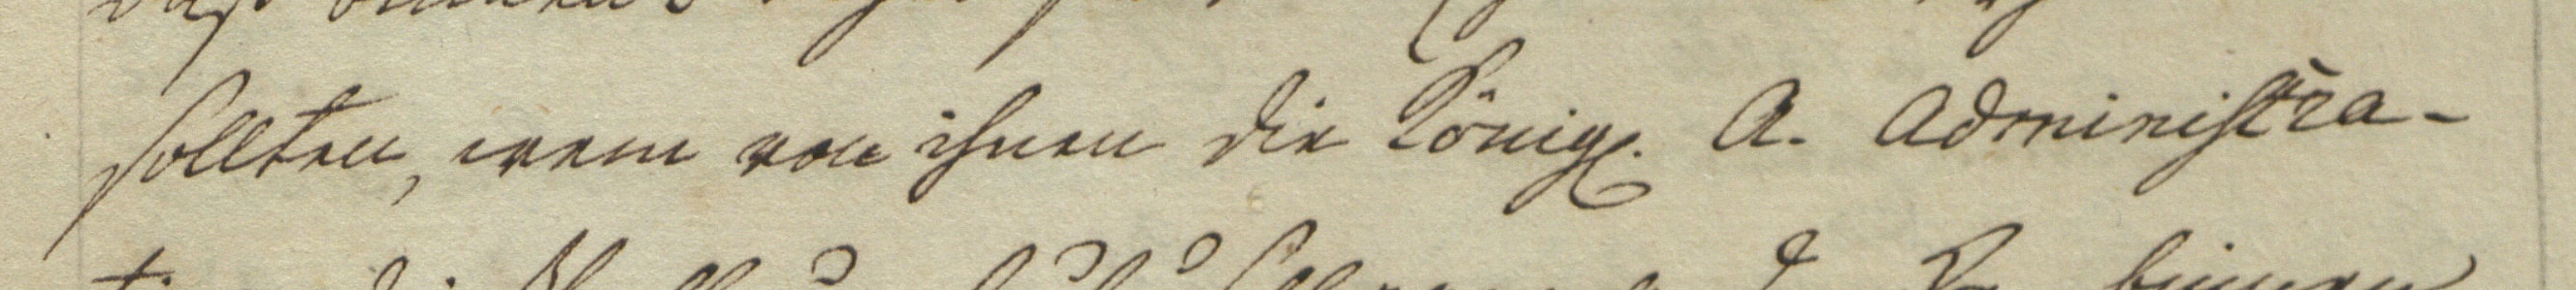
sollten, wem von ihnen die Königl. A. Administra¬
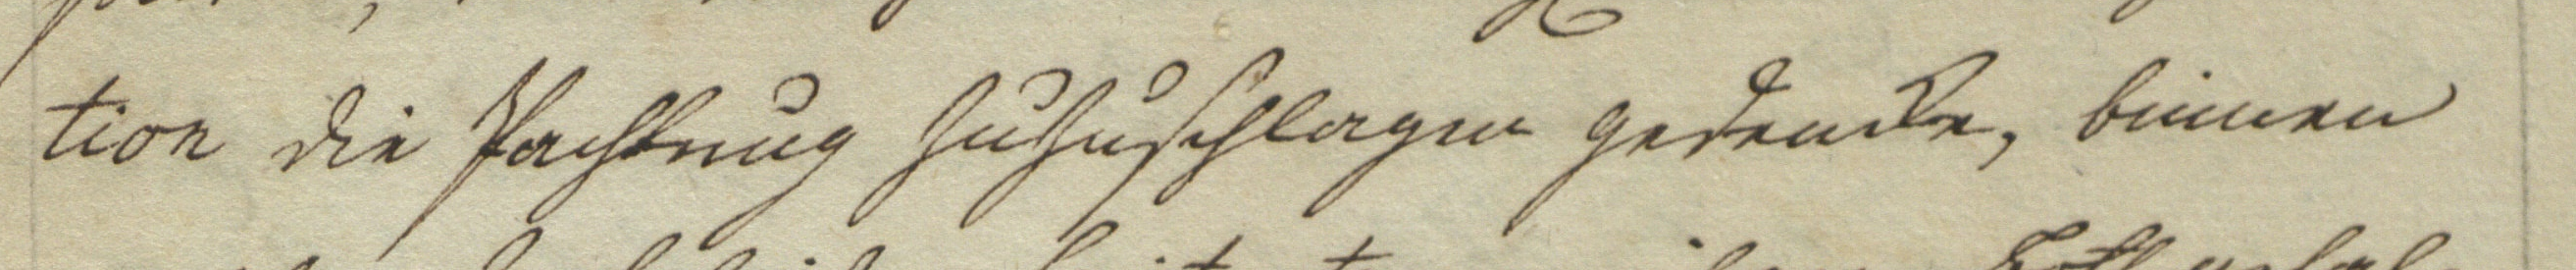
tion die Pachtung zuzuschlagen gedencke, binnen
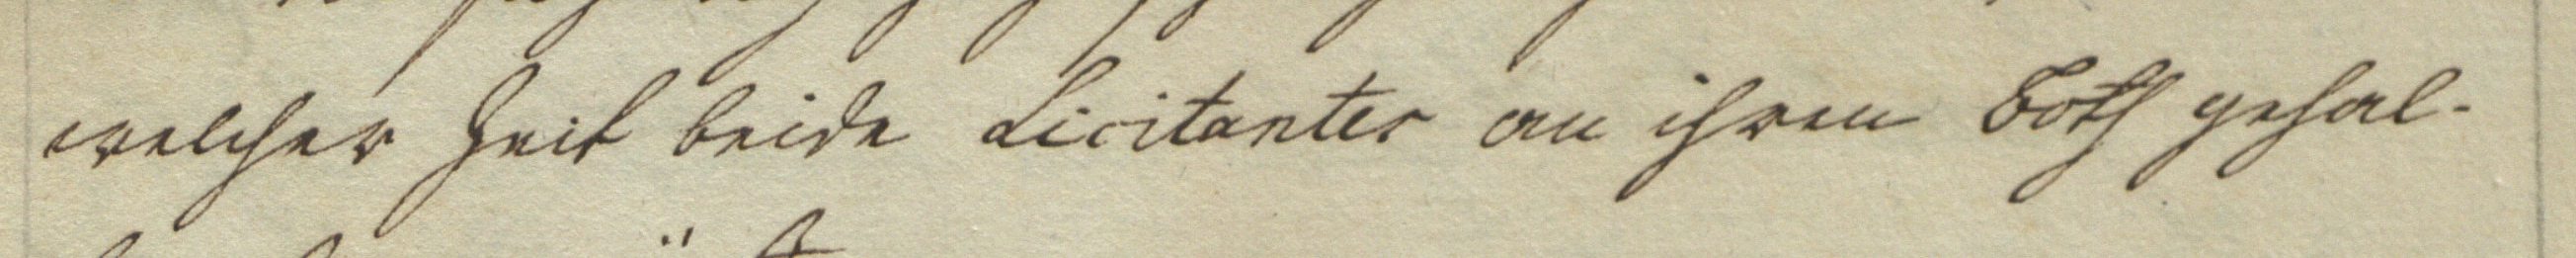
welcher Zeit beide Licitanten an ihrem Both gehal¬
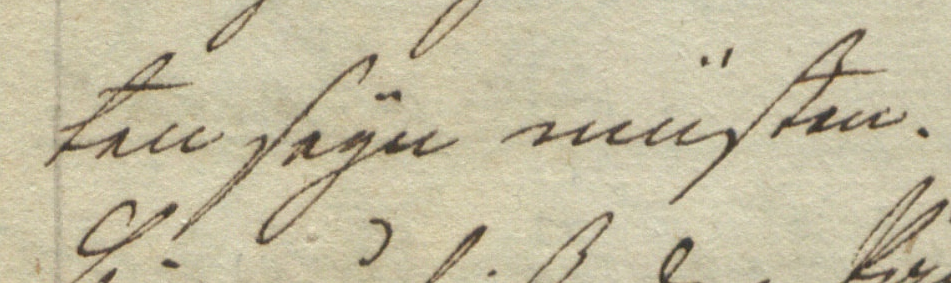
ten seÿn müßten.
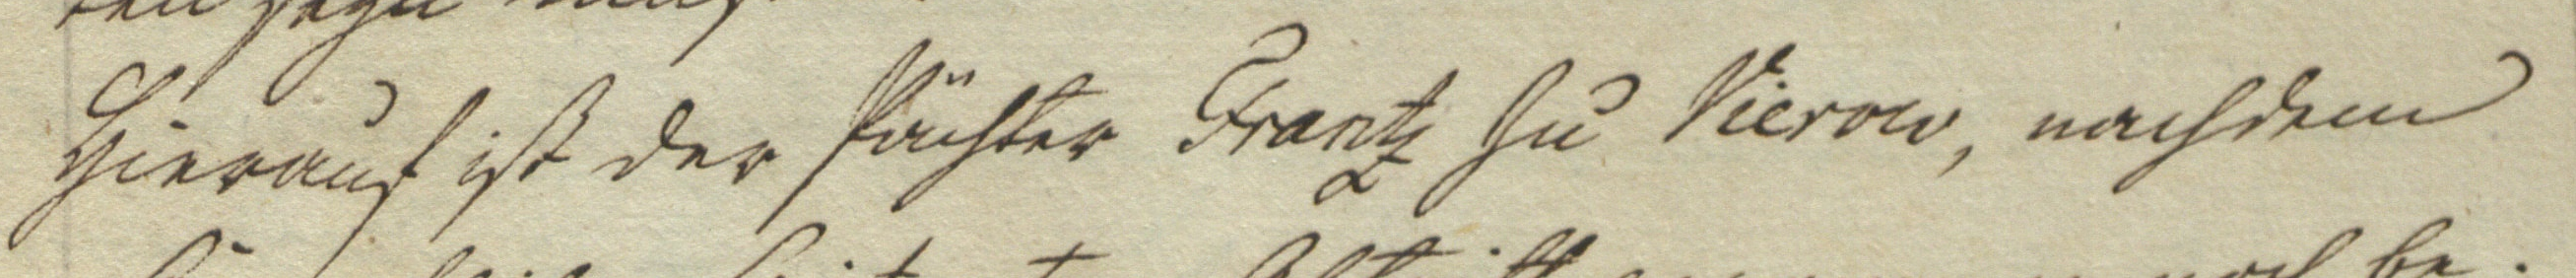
Hierauf ist der Pächter Frantz zu Vierow, nachdem
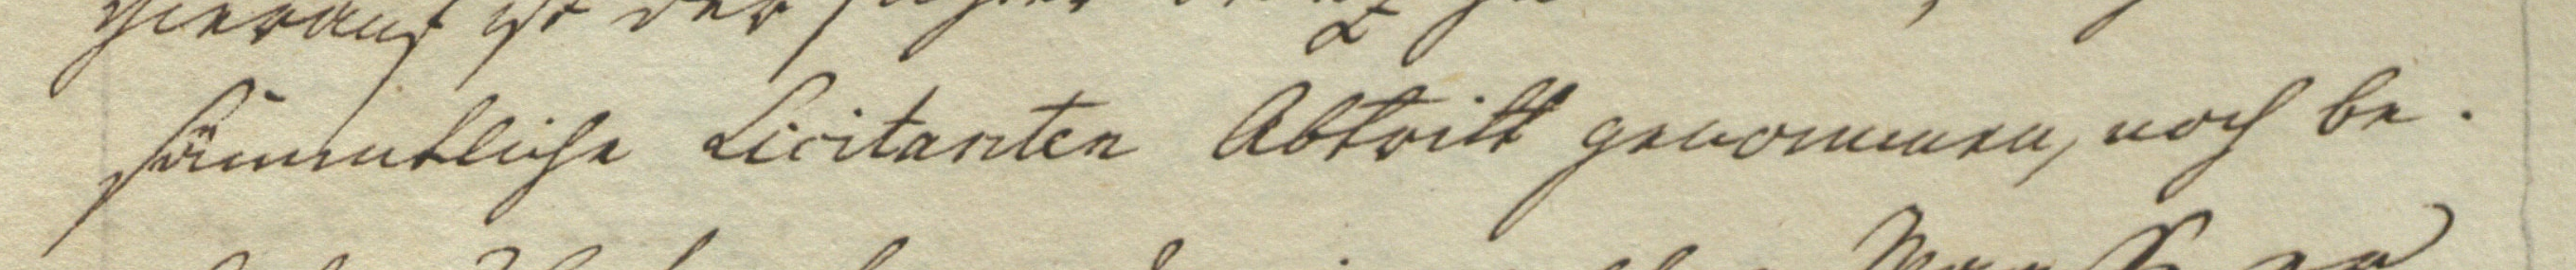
sämmtliche Licitanten Abtritt genommen, noch be¬
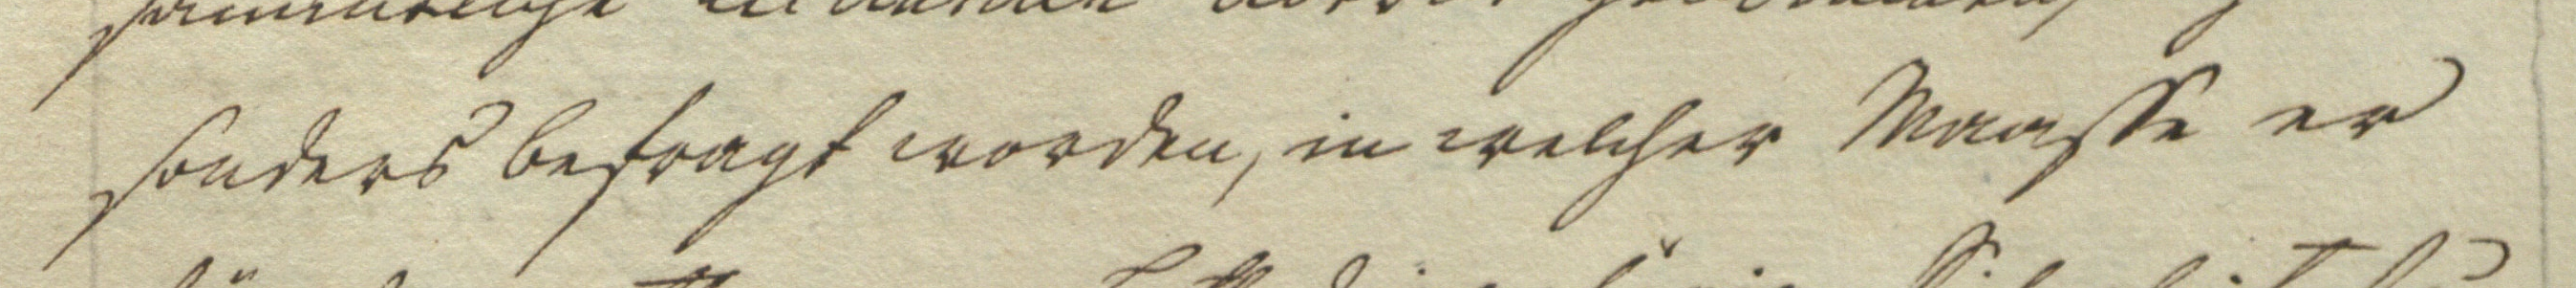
sonders befragt worden, in welcher Maasse er
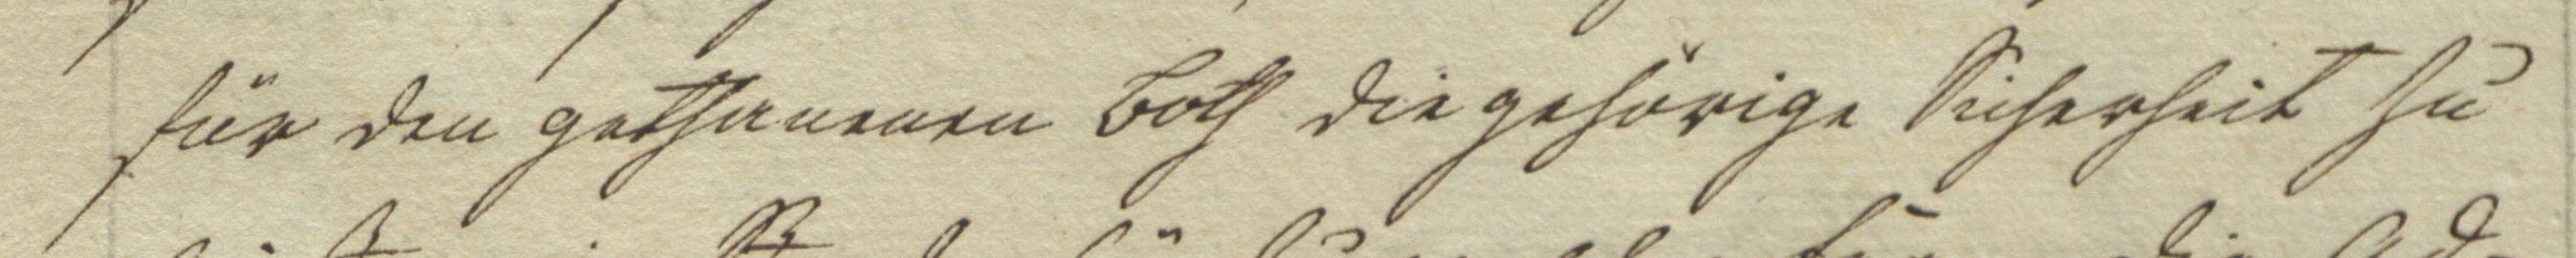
für den gethanenen Both die gehörige Sicherheit zu
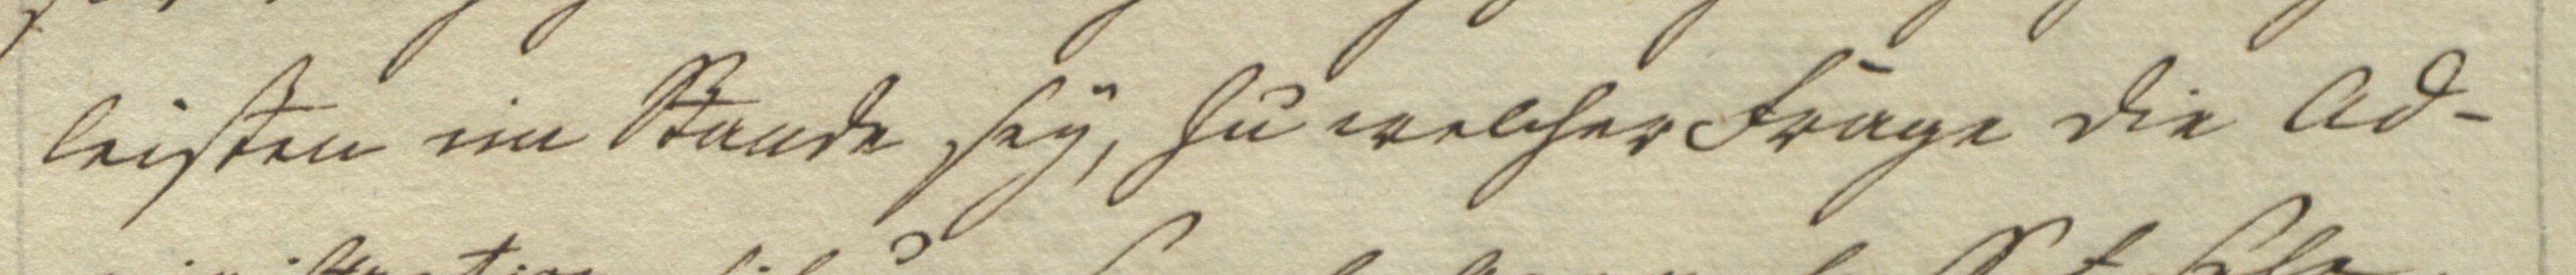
leisten im Stande seÿ, zu welcher Frage die Ad¬
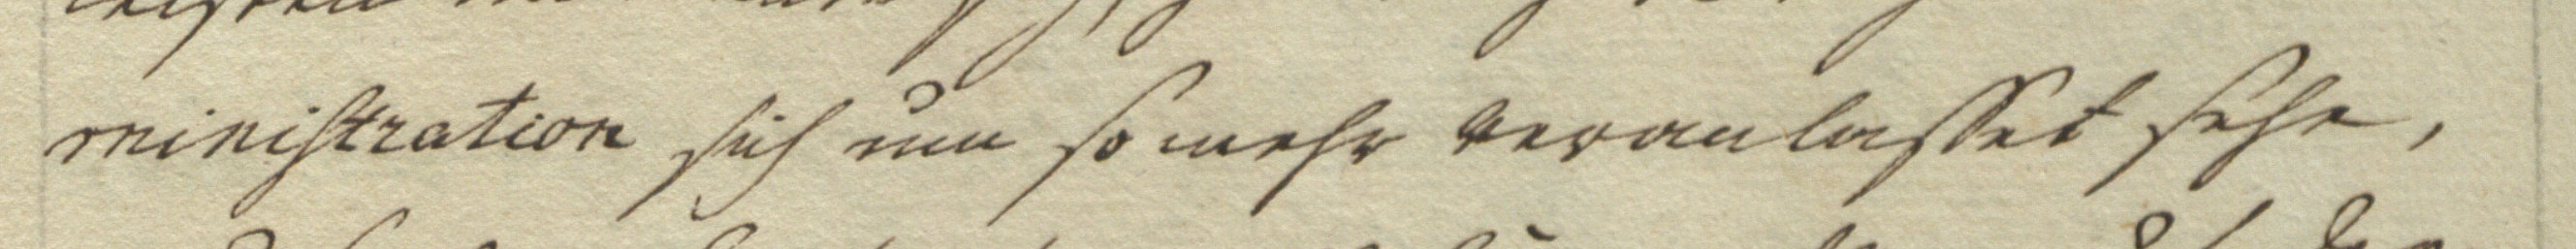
ministration sich um so mehr veranlasset sehe,
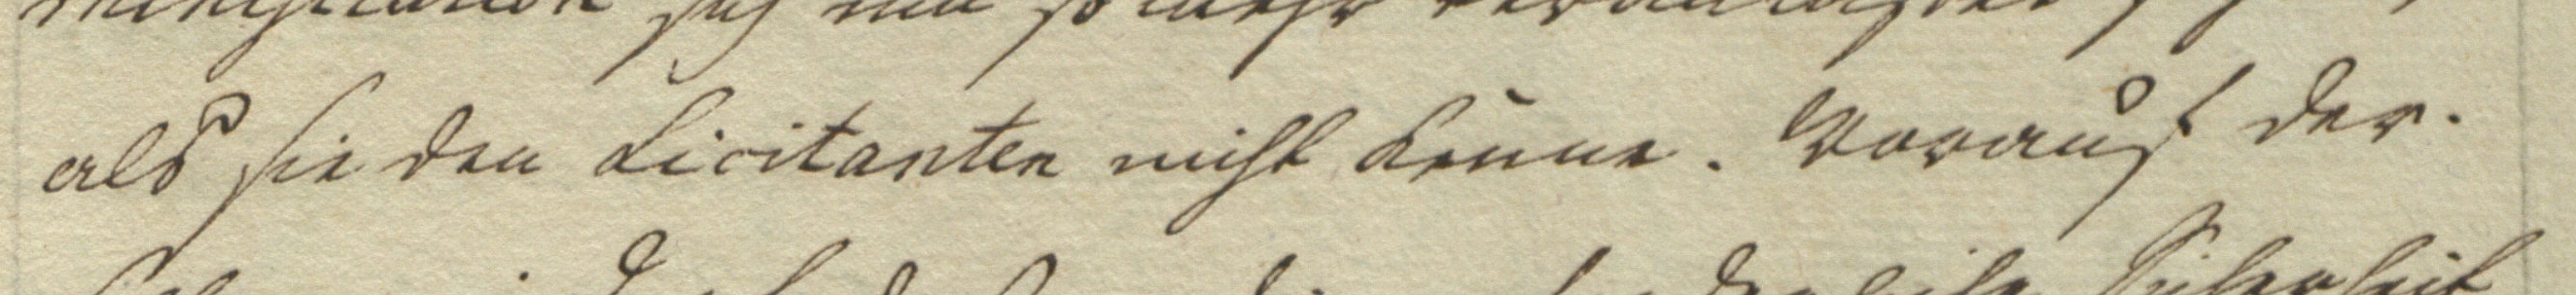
als sie den Licitanten nicht kenne. Worauf der¬
